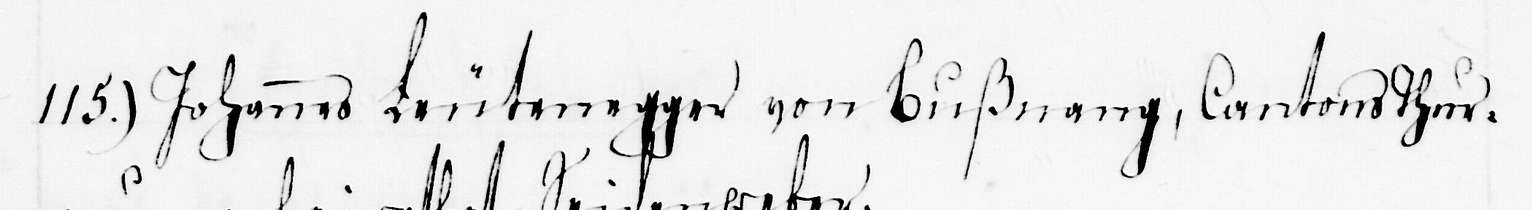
115.) Johannes Leutenegger von Bußnang, Cantons Thur¬
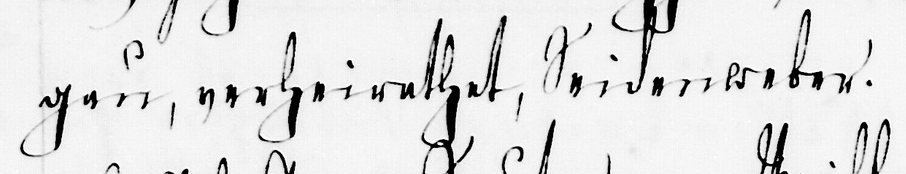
gau, verheirathet, Seidenweber.
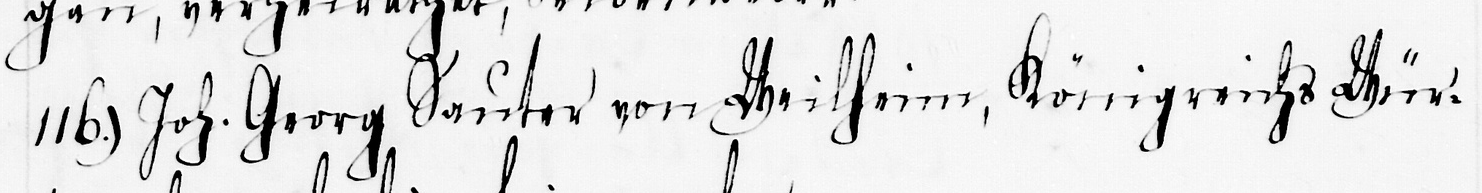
116.) Joh. Georg Sauter von Weilheim, Königreichs Wür¬
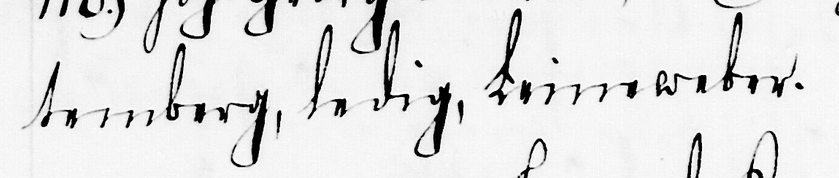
temberg, ledig, Leineweber.
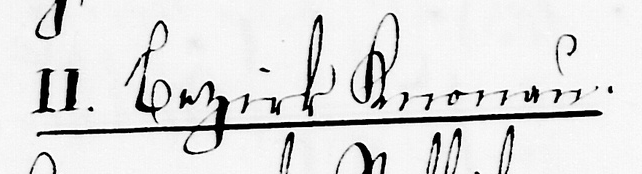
II. Bezirk Knonau.
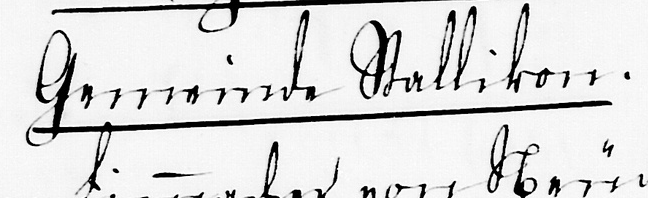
Gemeinde Stallikon.
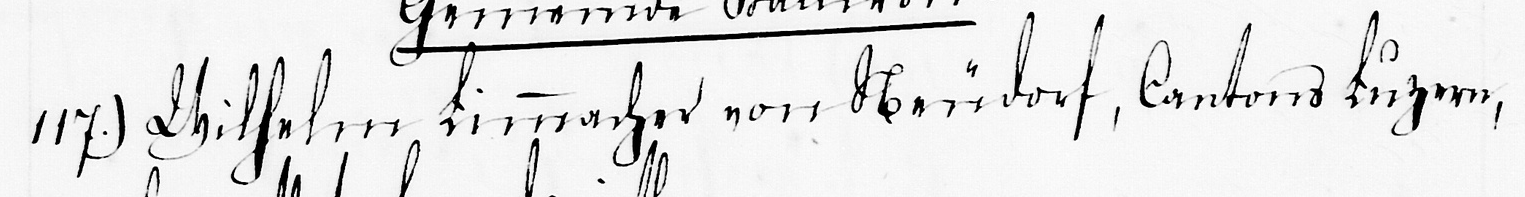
117.) Wilhelm Limmacher von Neudorf, Cantons Luzern,
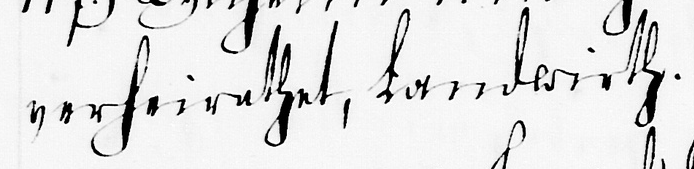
verheirathet, Landwirth.
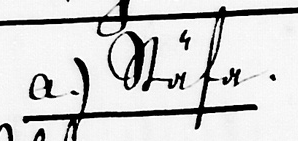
a.) Stäfa.
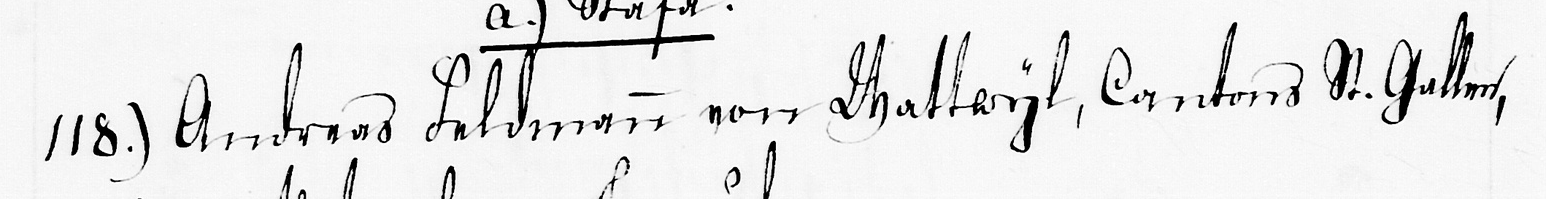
118.) Andreas Feldmann von Wattwyl, Cantons St. Gallen,
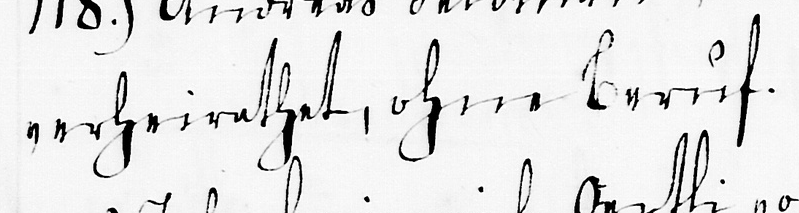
verheirathet, ohne Beruf.
